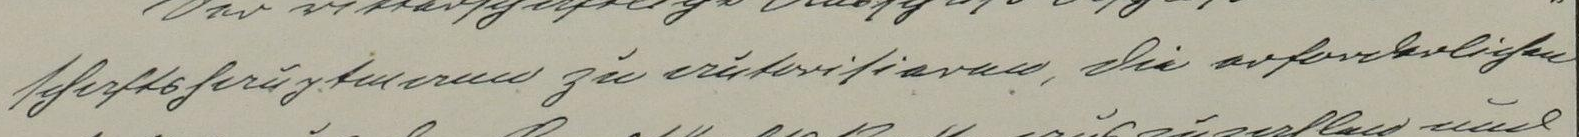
schaftshauptmann zu autorisieren, die erforderlichen
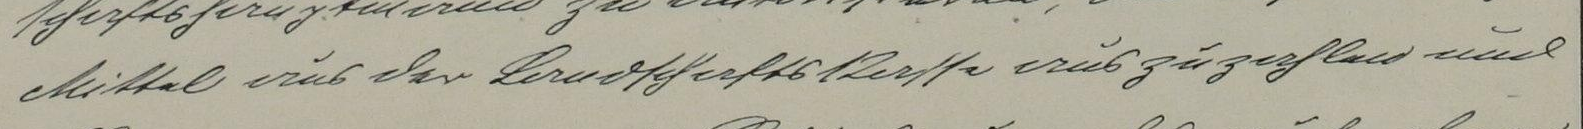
Mittel aus der Landschaftskasse auszuzahlen und
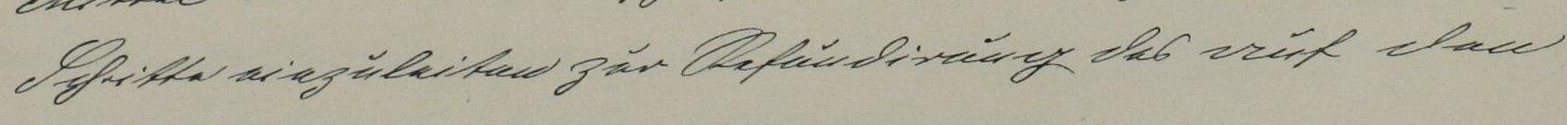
Schritte einzuleiten zur Refundierung des auf den
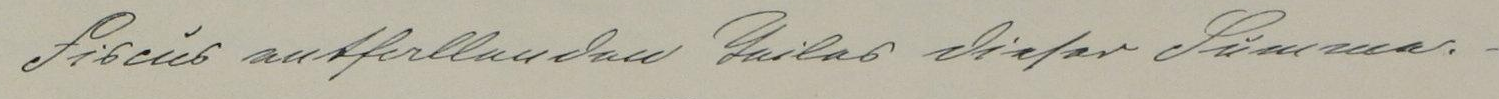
Fiscus entfallenden Teiles dieser Summe.
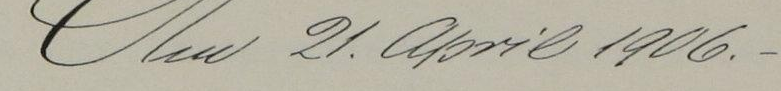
Am 21. April 1906.
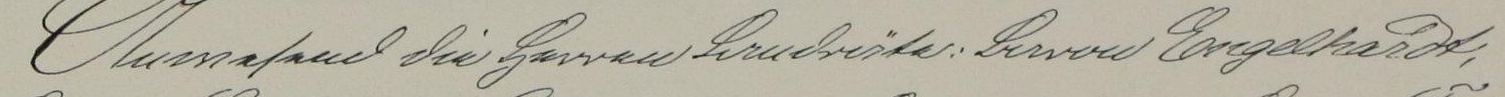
Anwesend die Herren Landräte: Baron Engelhardt,
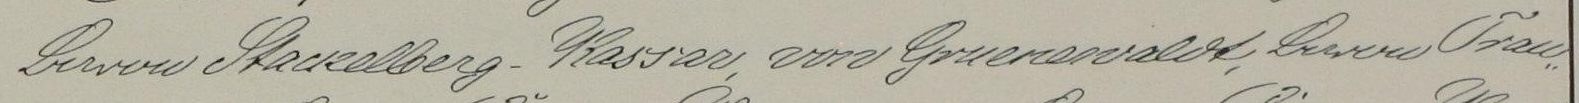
Baron Stackelberg-Kassar, von Gruenewaldt, Baron Trau-
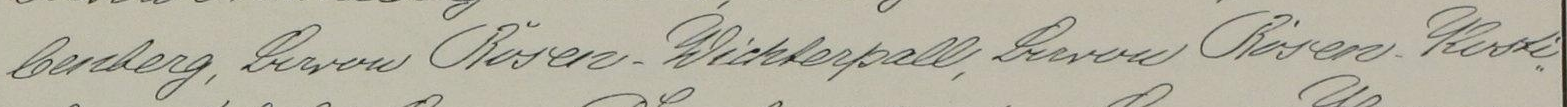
benberg, Baron Rosen-Wichterpall, Baron Rosen-Kosti-
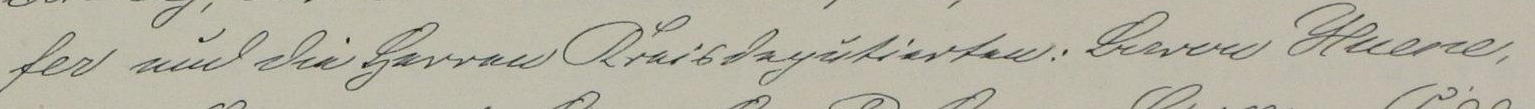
fer und die Herren Kreisdeputierten: Baron Huene,
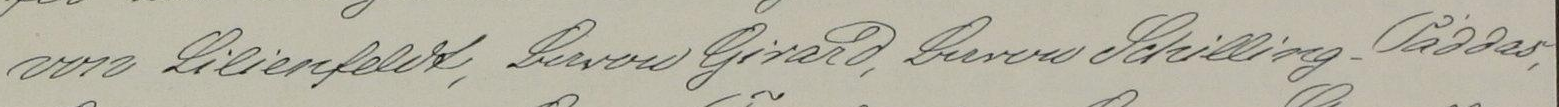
von Lilienfeldt, Baron Girard, Baron Schilling-Paddas,
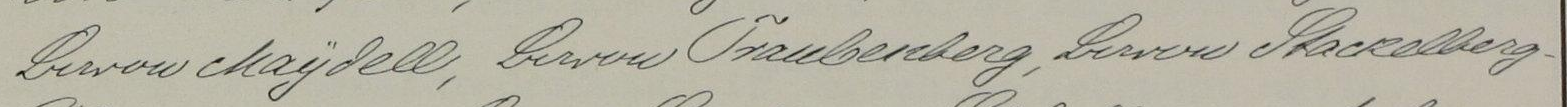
Baron Maydell, Baron Traubenberg, Baron Stackelberg-
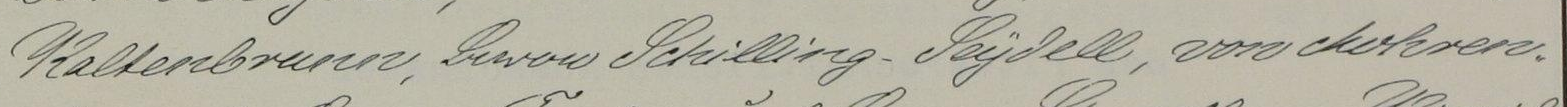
Kaltenbrunn, Baron Schilling-Seydell, von Mohren-
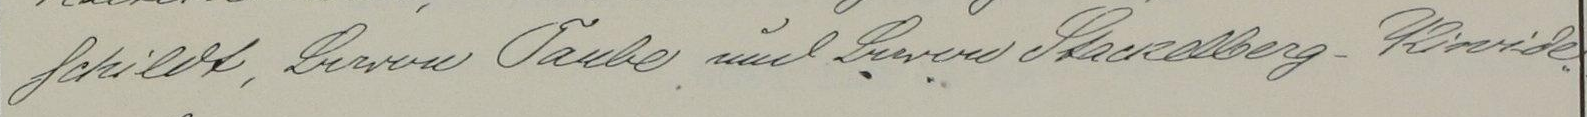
schildt, Baron Taube und Baron Stackelberg-Kiwide-
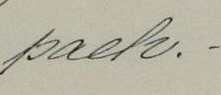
paeh.
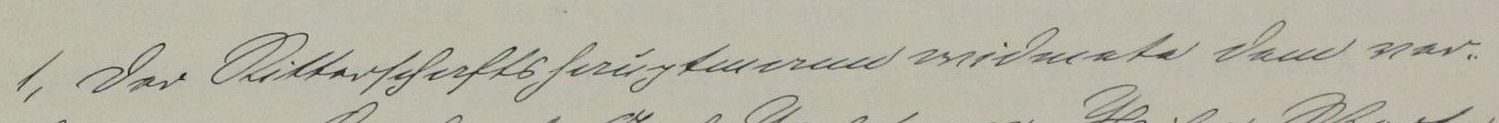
1. Der Ritterschaftshauptmann widmete dem ver-
